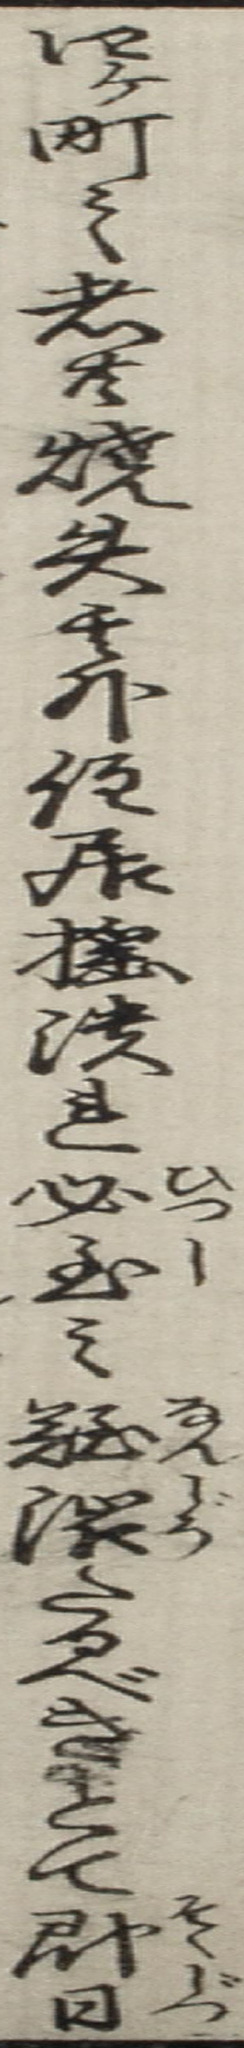四ケ町之者共焼失其外住居揺潰れ必至之難渋たるべきとて即日
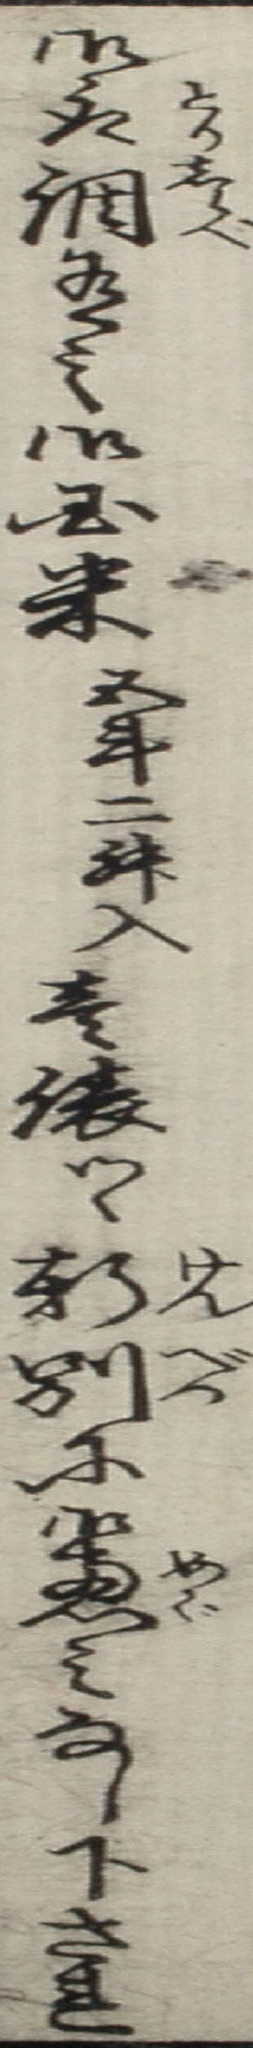御取調有之御国米五斗二升入壱俵ツゝ軒別に御恵みなし下され
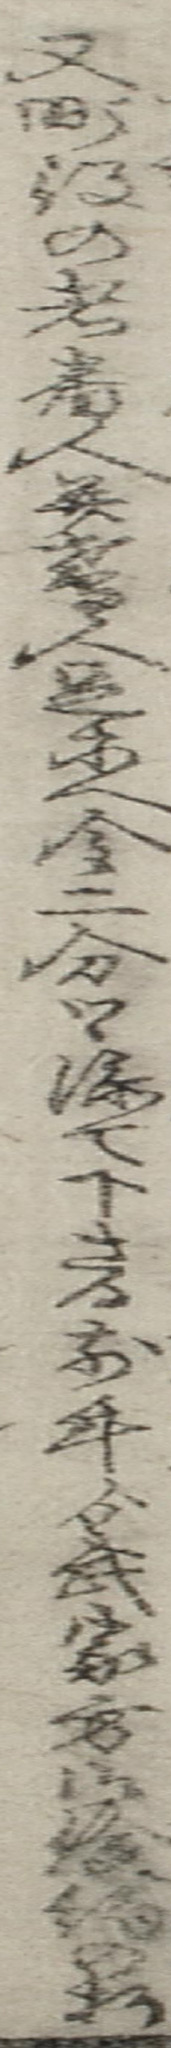又町役の者番人幷鳶人足等へ金二分ツゝ添て下さる前年ゟ武家方御倹約の折
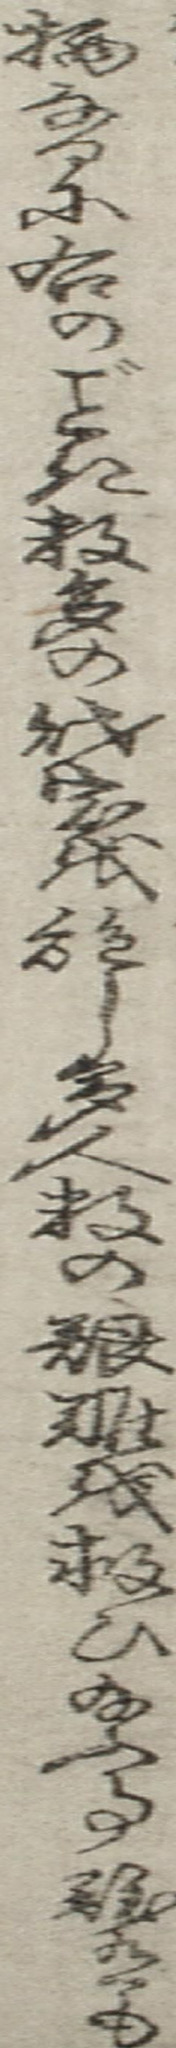柄なるに右のごとき数多の財宝を施し多人数の艱難を救ひ給ふ事難有も
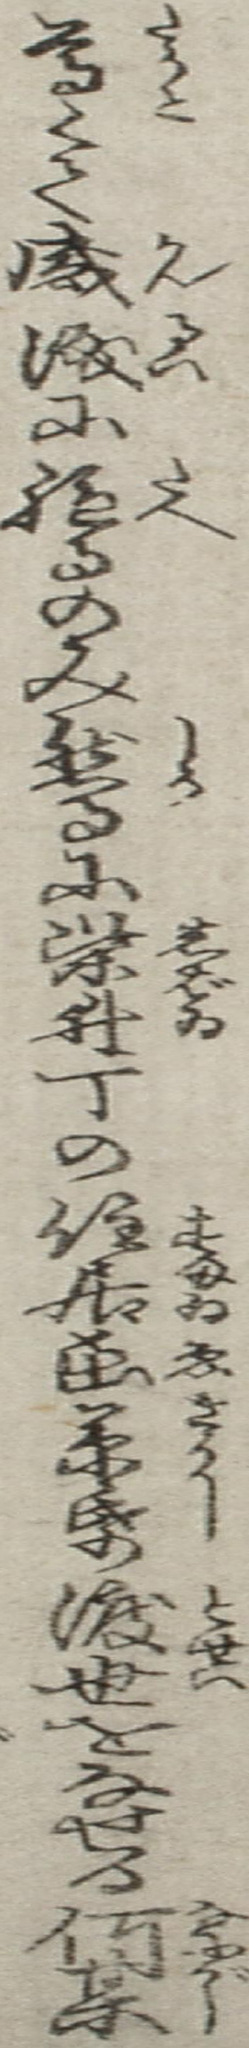尊くて感涙に絶るのみ然るに柴井丁の住居画草紙の渡世をなせる何某
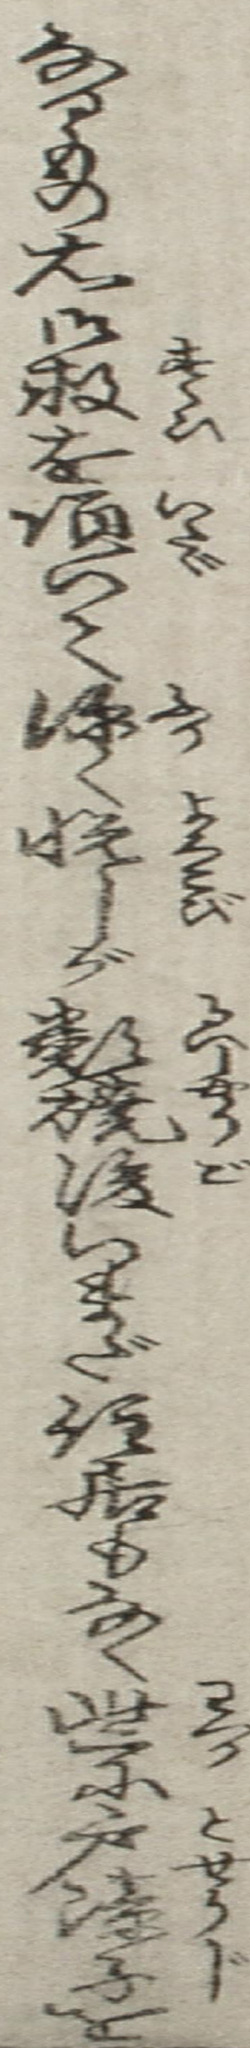なるもの右御救を頂いて深く悦しが類焼後いまだ住居もなく些に戸障子を
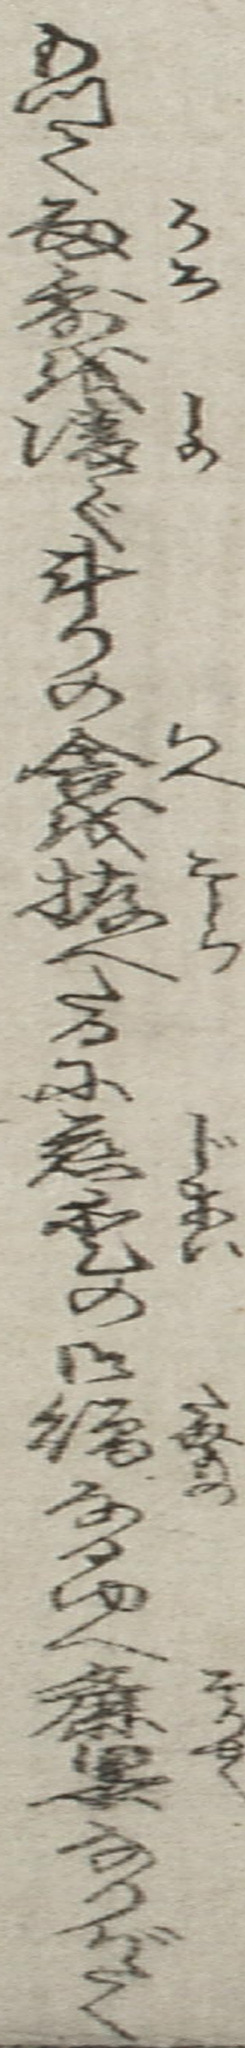もつて雨露を凌ぐ計りの舎を拵へたるに慈愛の御賜なるゆへ麁略なりがたく
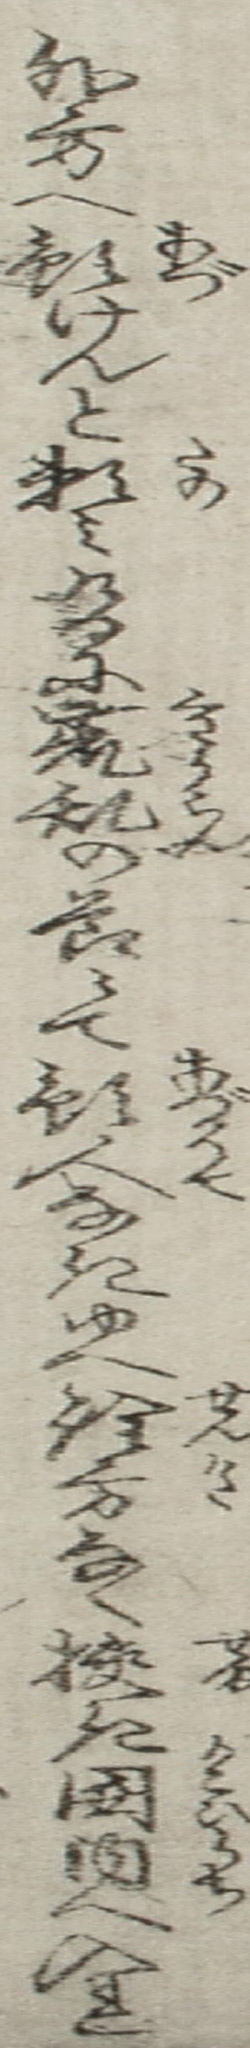外方へ預けんと頼みけるに荒乱の節にて預人なきゆへ詮方なく狭き囲内へ入れ
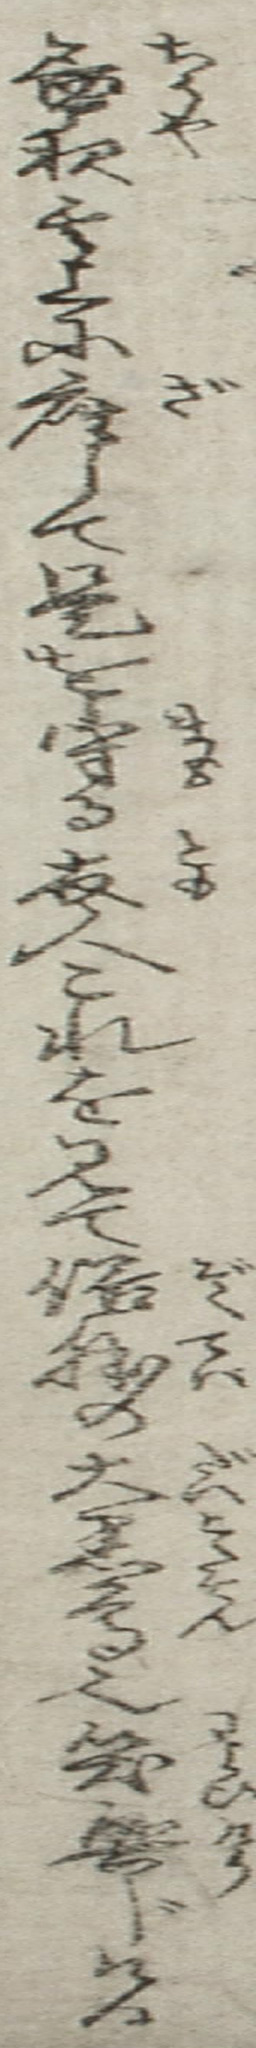昼夜其上に座して是を守る友人これを見て俗躰の大国尊也笑興じける
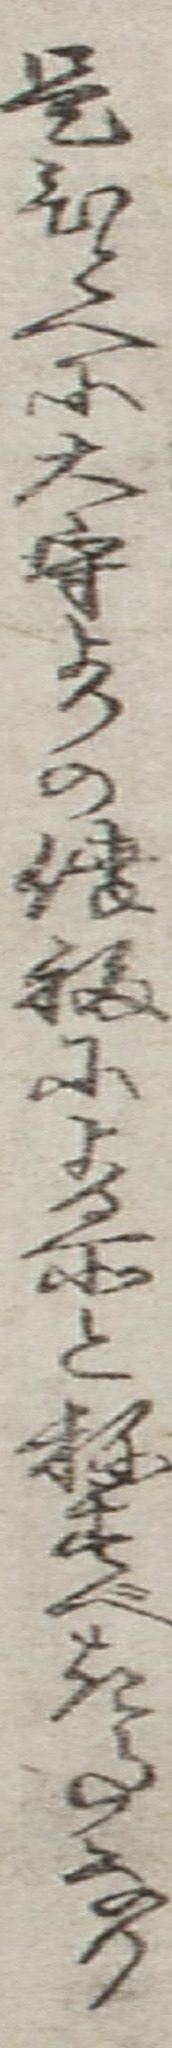是ひとへに太守よりの倖福による所と称すべき事なり
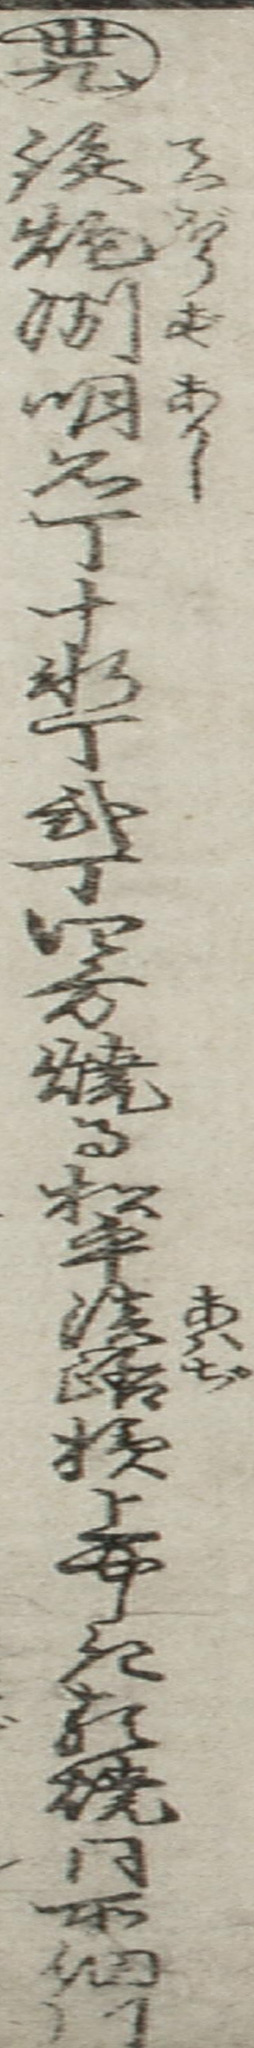鉄砲洲明石丁十軒丁弐丁四方焼る松平淡路様上やしき類焼同所細川
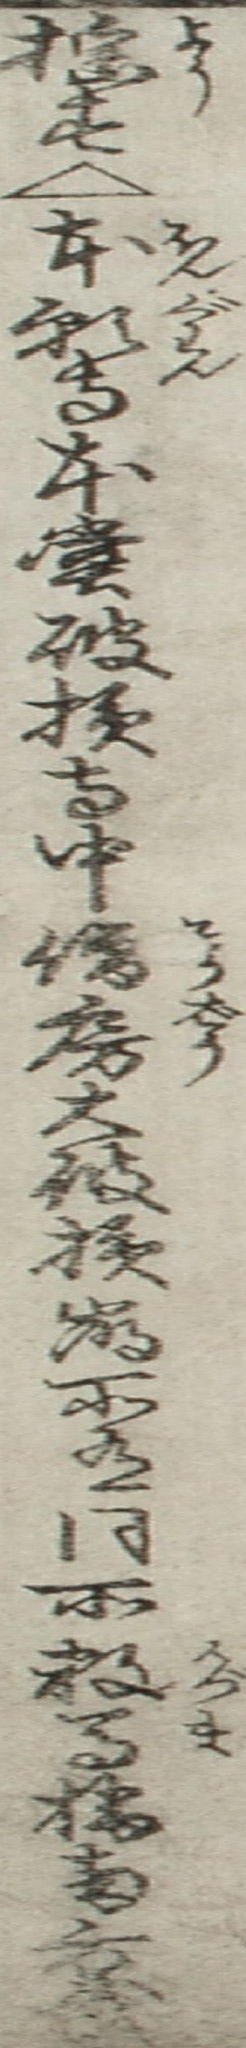揺す△本願寺本堂破損寺中僧房大破損崩所有同所数馬橋南方武家
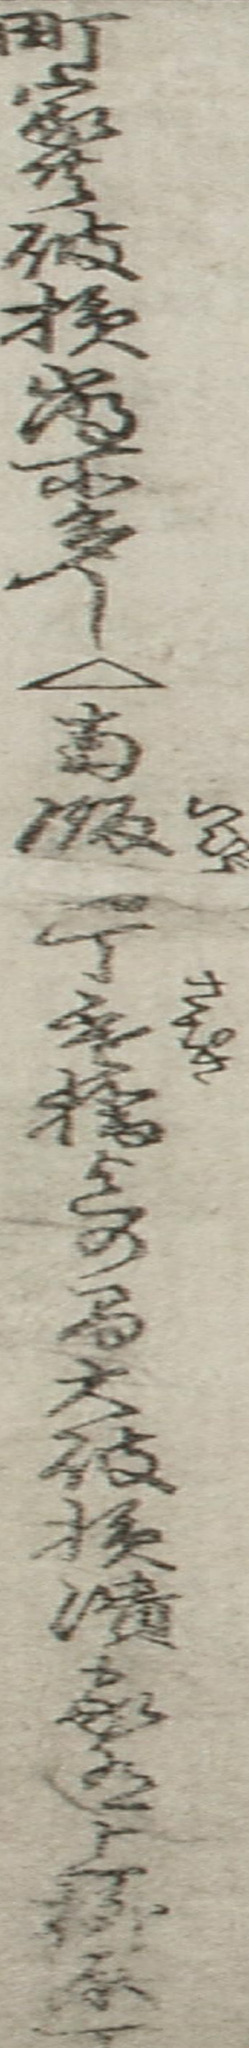町家共破損崩所多し△南飯田丁寒橋迄の間大破損潰家有上柳原丁

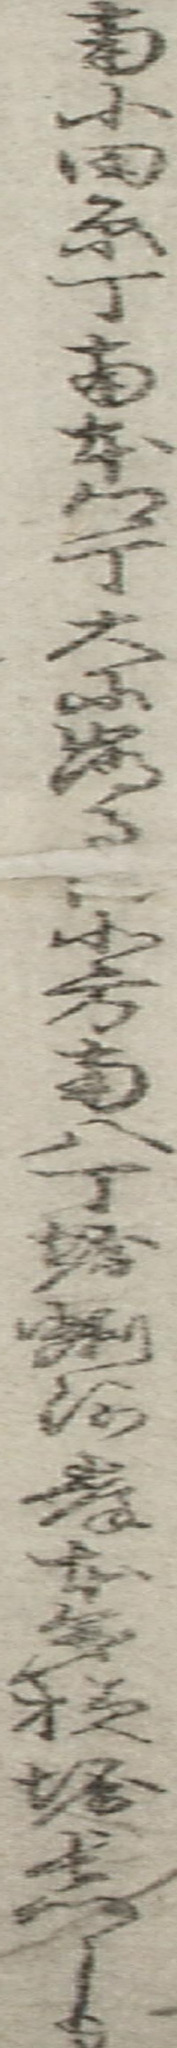南小田原丁南本郷丁大小崩る同北方南八丁堀蜊河岸本多様堀長門しも
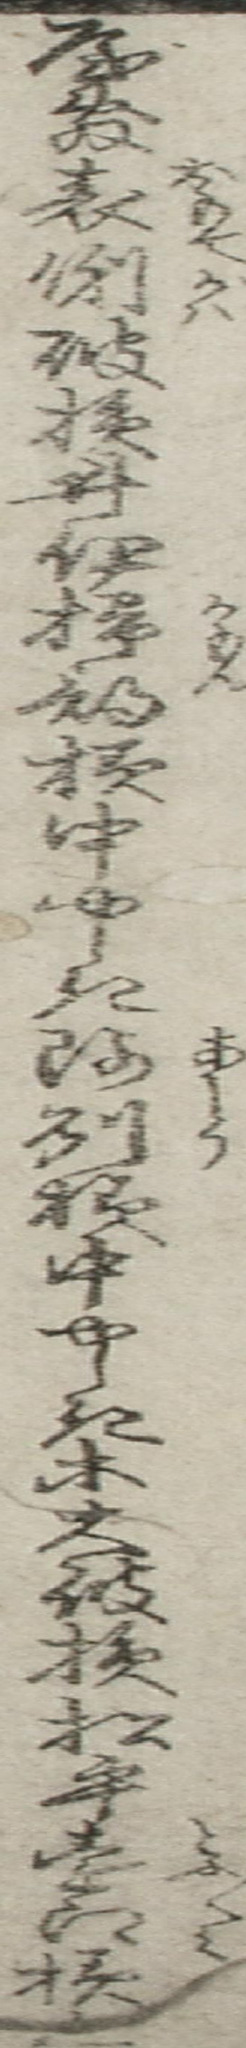屋敷表側破損井伊掃部様中やしき阿州様中やしき等大破損松平遠江様上
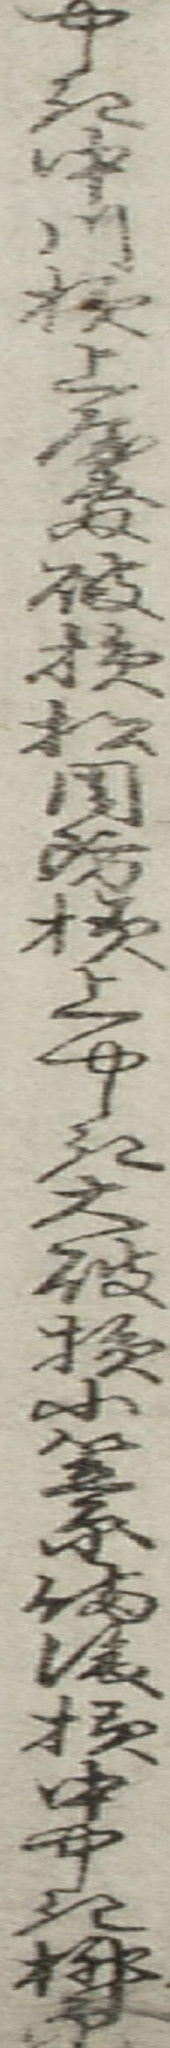やしき中川様上屋敷破損松周防様上やしき大破損小笠原備後様中やしき榊原
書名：安政見聞誌　下
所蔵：東京大学地震研究所図書室 Earthquake Research Institute Library, The University of Tokyo, JAPAN
